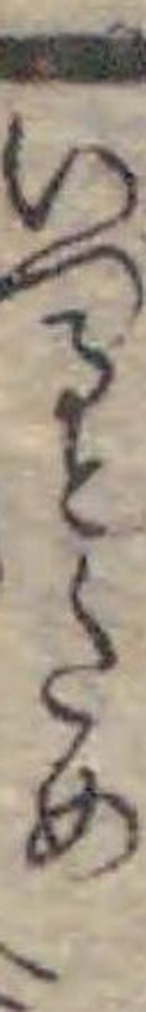いづるとため
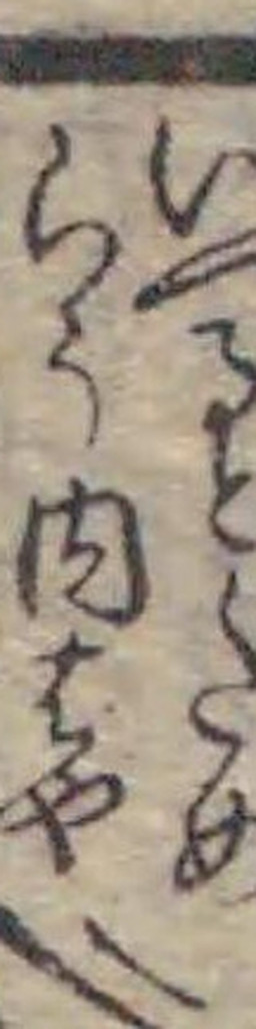らう内はや
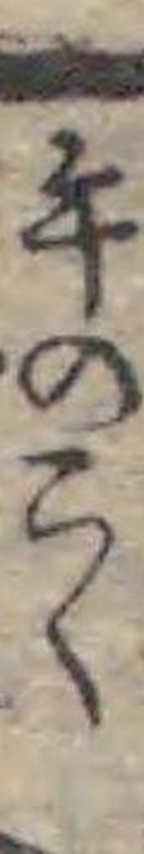午のこく
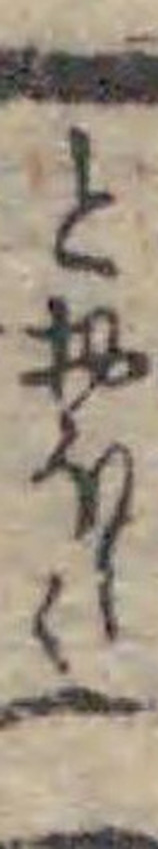とおほしく
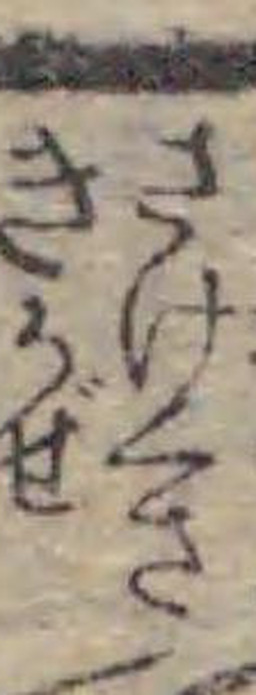きかぜ
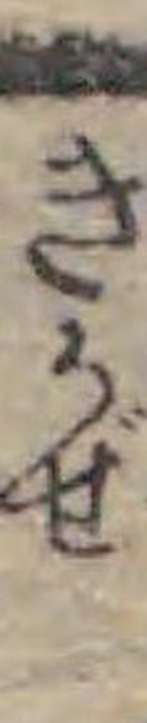きかぜ
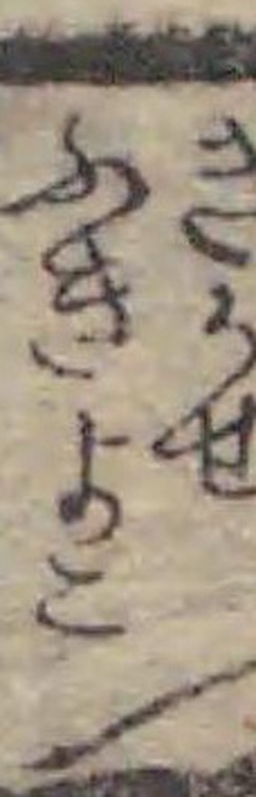ふきよこ
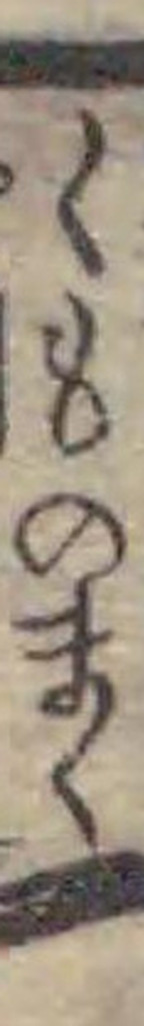くものまく
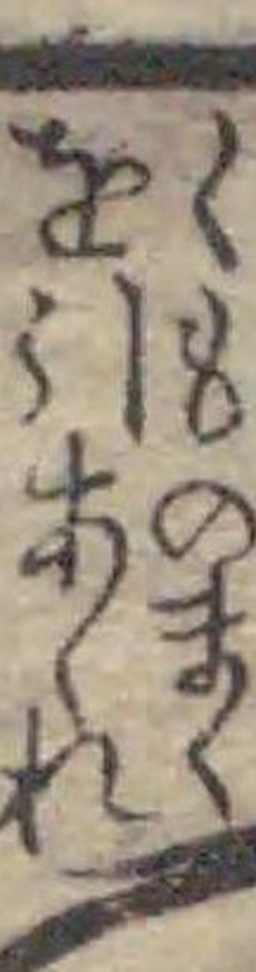を引あくれ
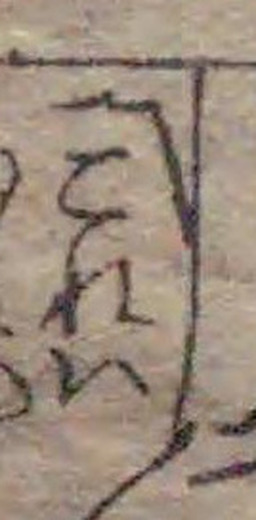〽これは
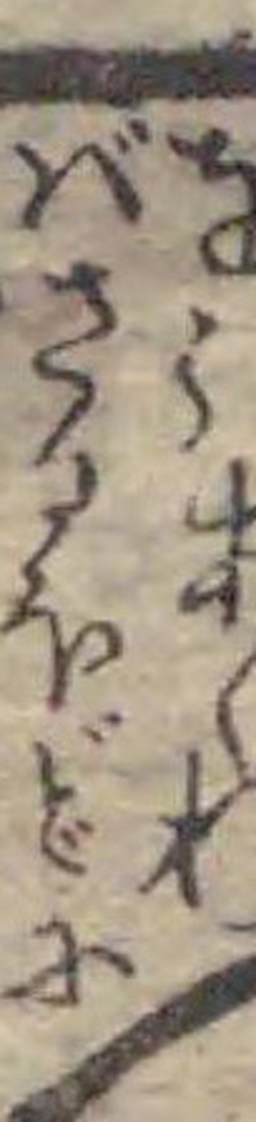ばさるほどに
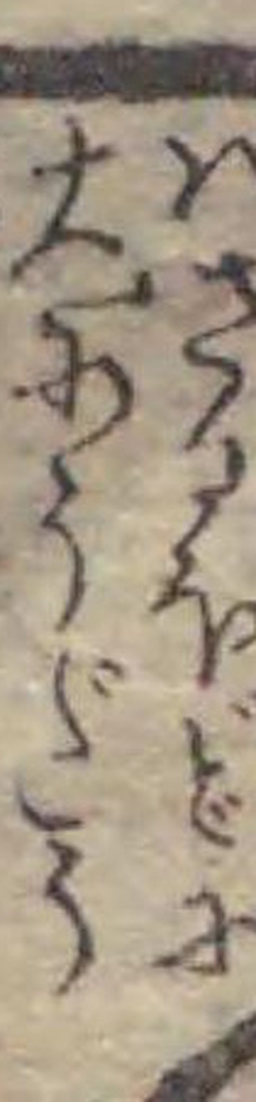大にうだう
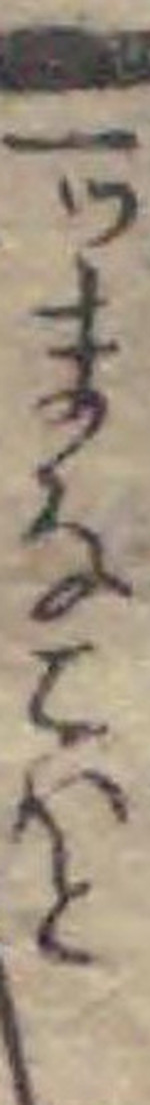一ツまなこはと
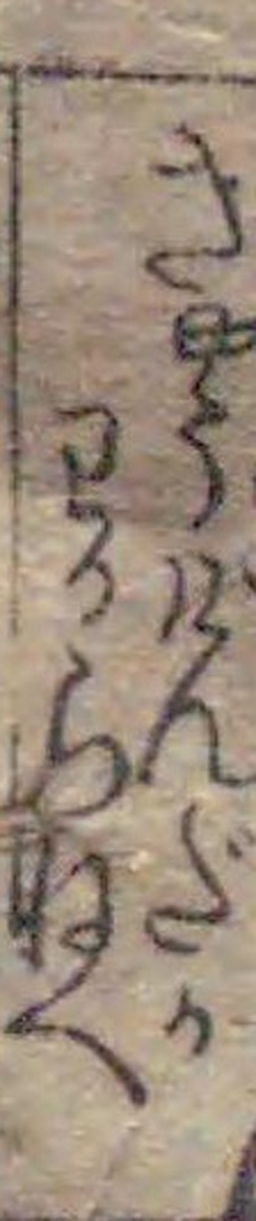わからねへ
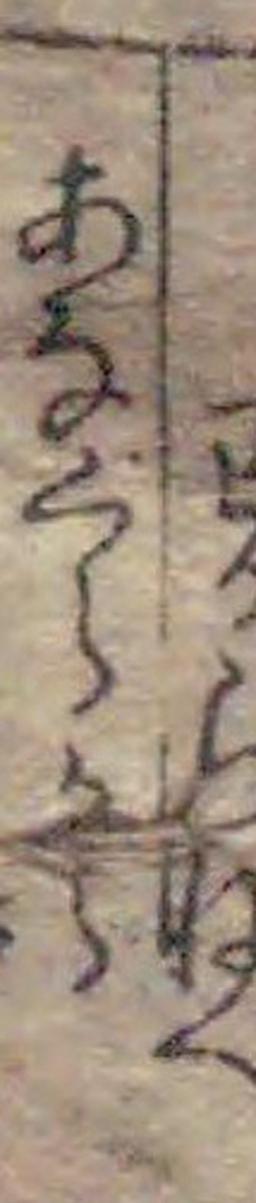あなぐらから
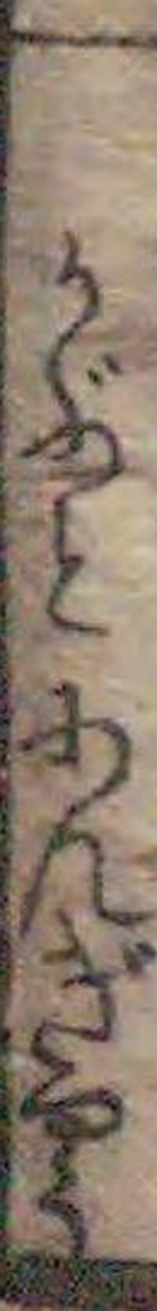かぶとにんぎやう
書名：怪物つれつれ草 : 2巻
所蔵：国立国会図書館 National Diet Library, JAPAN
